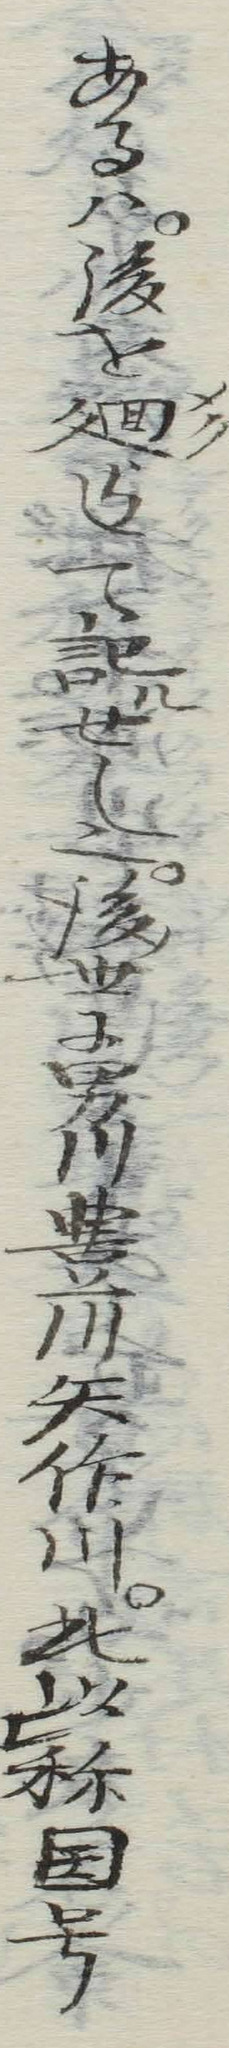あるは。後を廻らして記せし也。後世に男川豊川矢作川。此以称国号
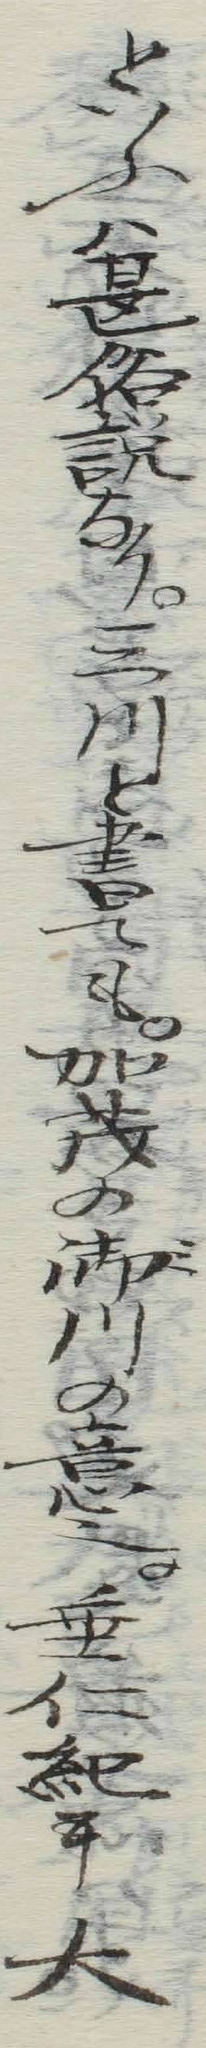といふは甚俗説なり。三川と書ても。加茂の御川の意也。垂仁紀に大
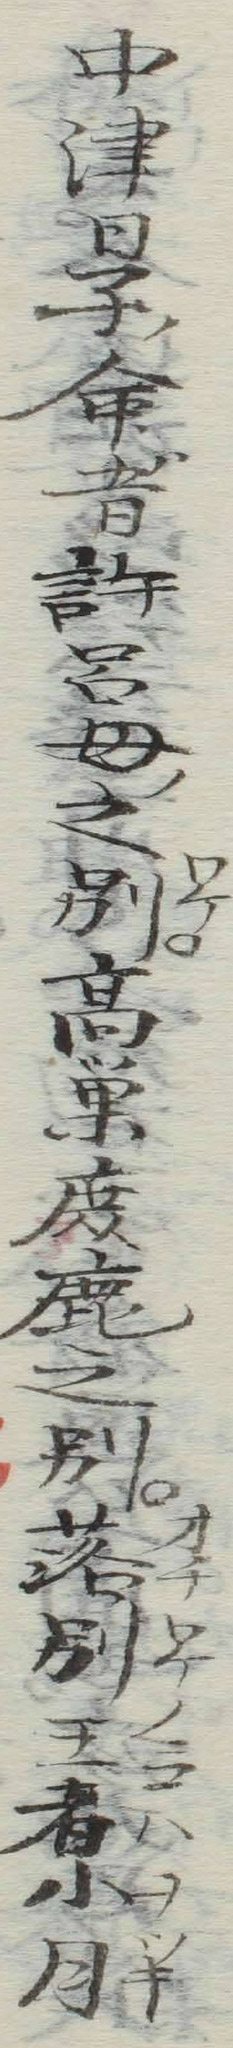中津日子命者許呂母之別。高巣庶鹿之別。落別王者小月
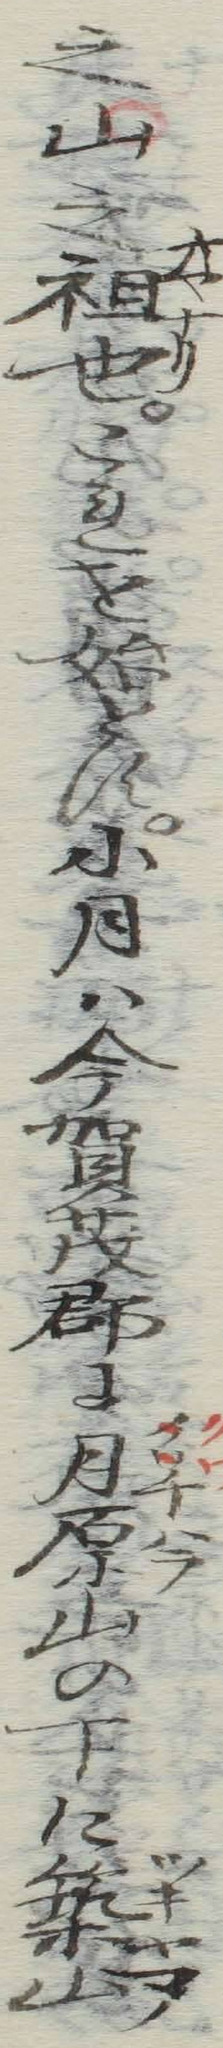之山之祖也。これを始とす。小月は今賀茂郡に月原山の下に築山
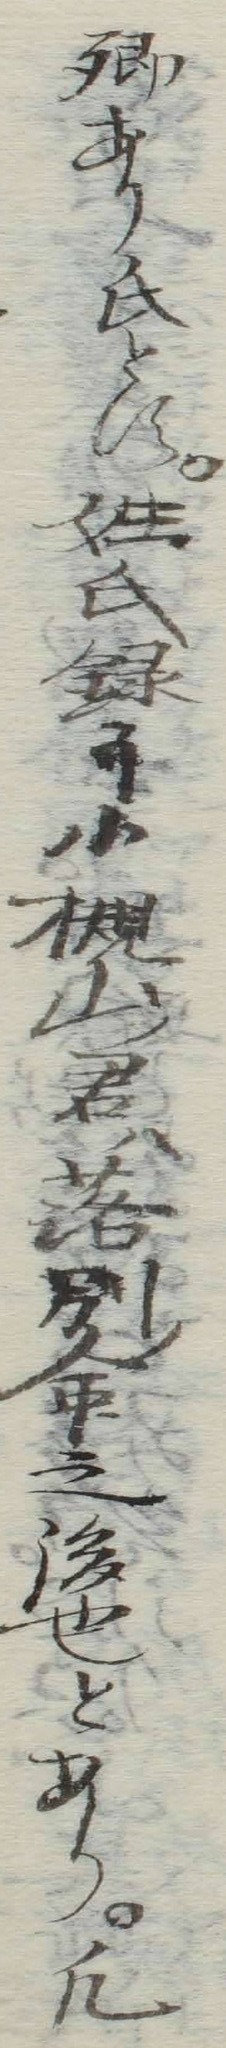郷あり氏とす。姓氏録に小槻山君落別命之後也とあり。凡
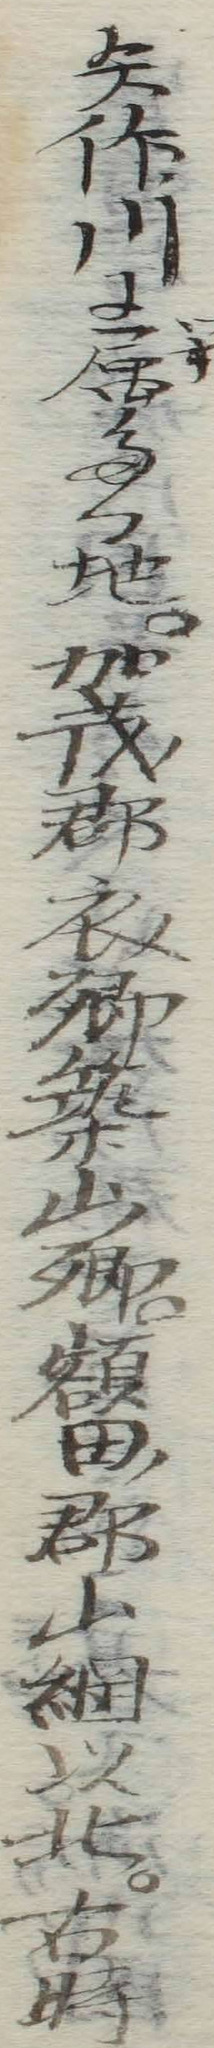矢作川に属たる地。加茂郡衣郷築山郷。額田郡山綱以北。古時

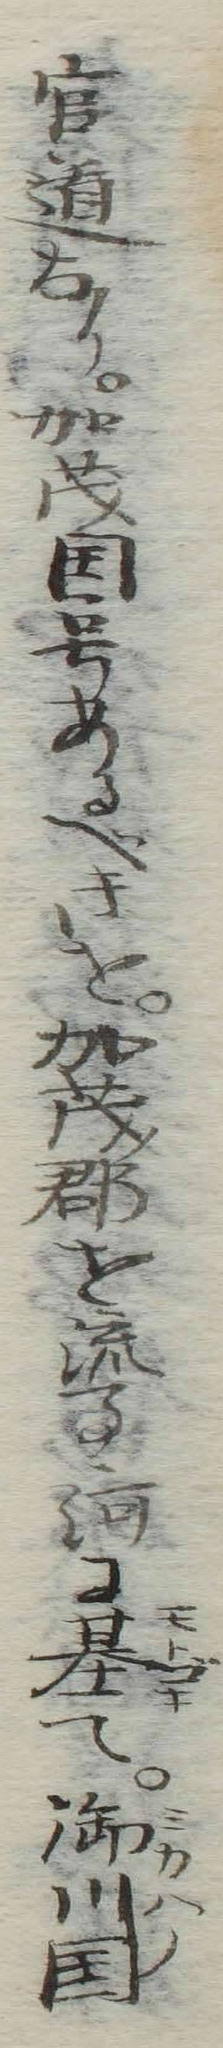官道なり。加茂国号あるべきを。加茂郡を流るゝ河に基て。御川国
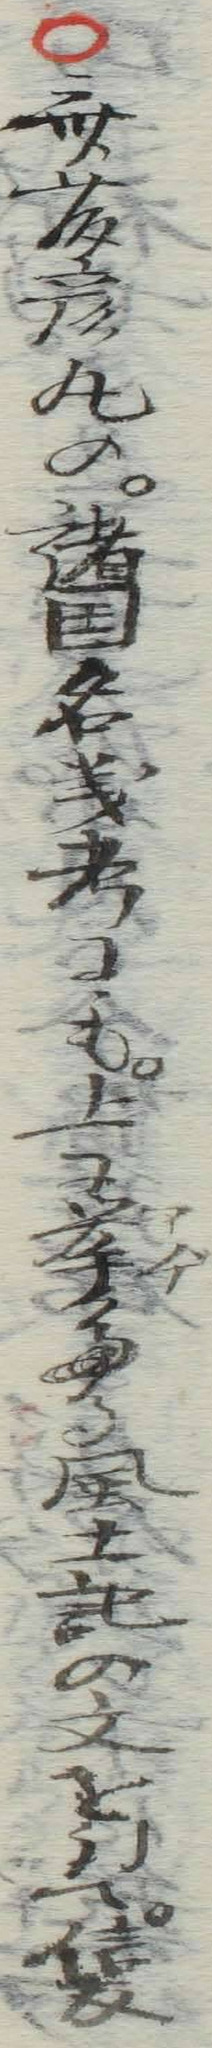〇斎藤彦丸の。諸国名義考にも。上に挙たる風土記の文を引て。信友
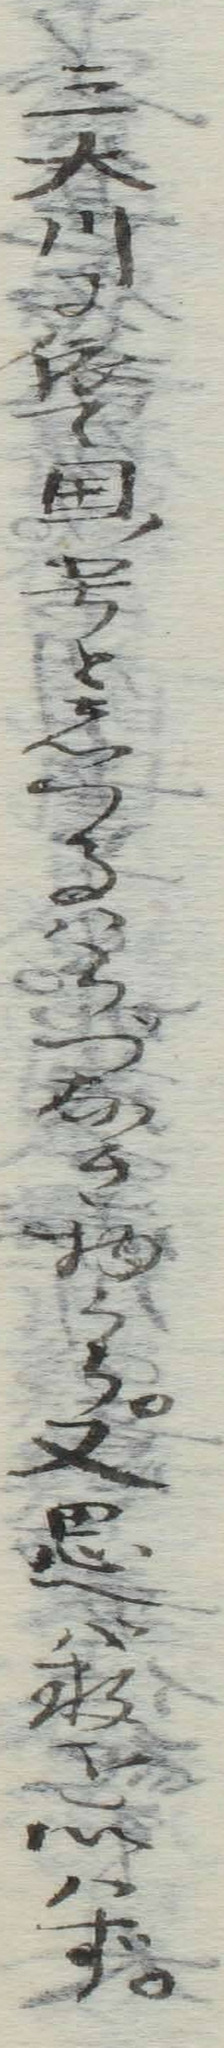三大川に依て国号としつるはかづなき物から。又思へば救をいはず。
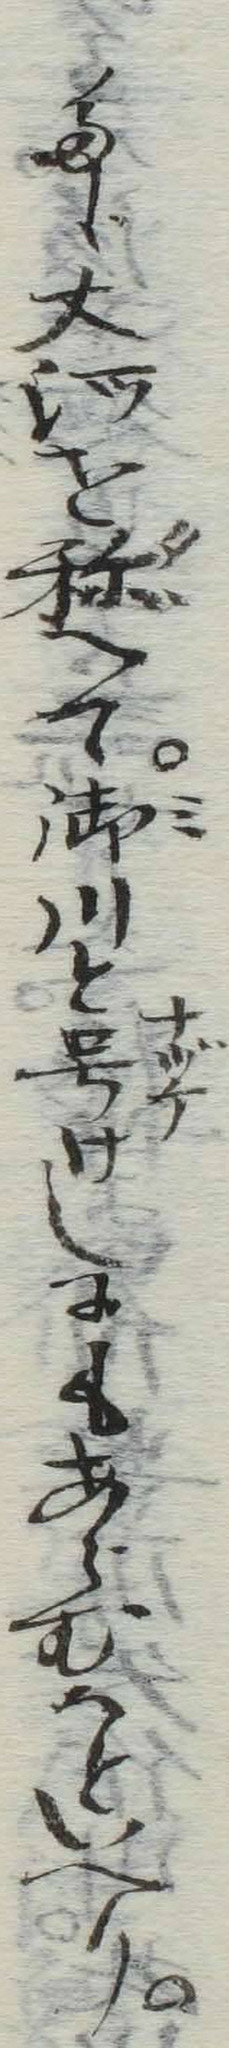たゞ大河を称へて。御川と号けしにもあらむかといへり。
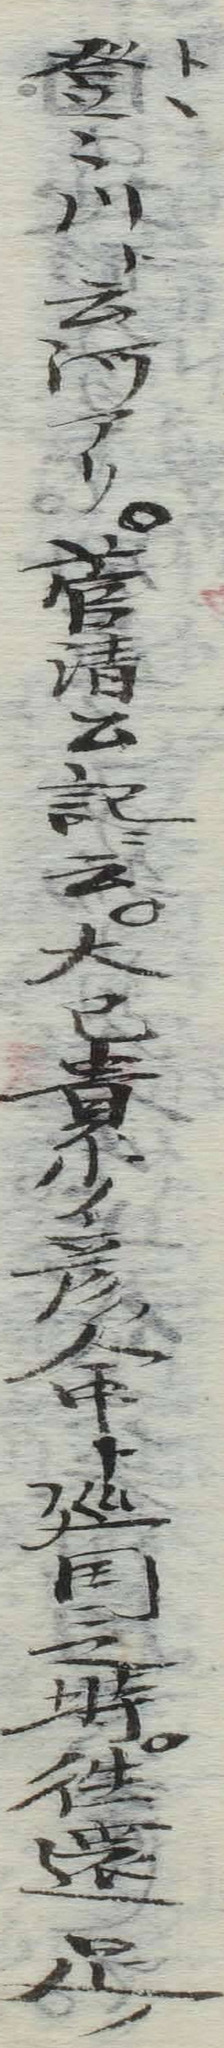登々川云河アリ。菅清公記云。大已貴少彦命ト巡国之時。往還足
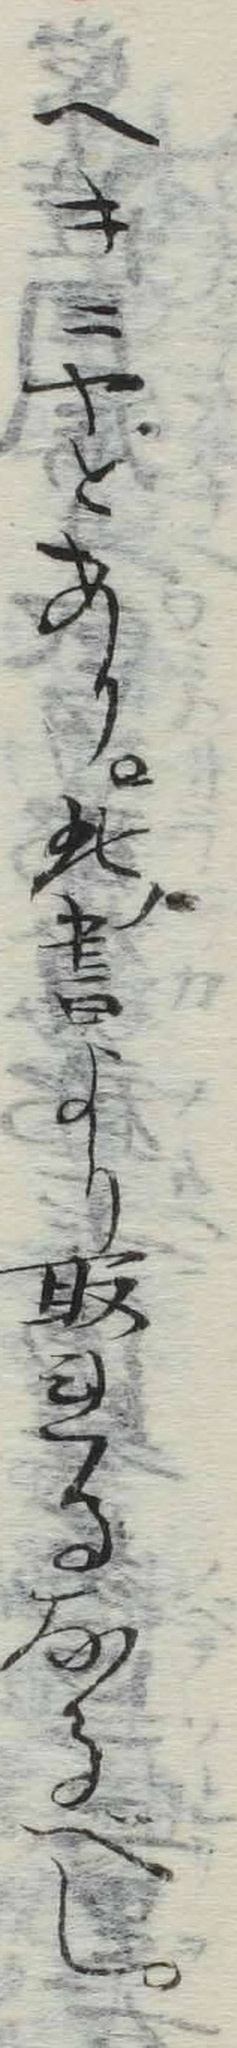ヘキニヤとあり。此書より取れるなるべし。
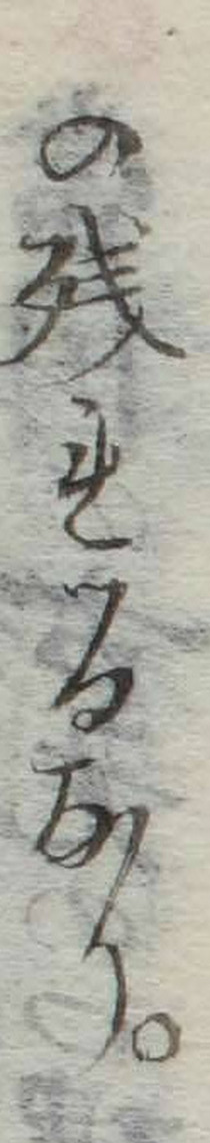の残れるなり。

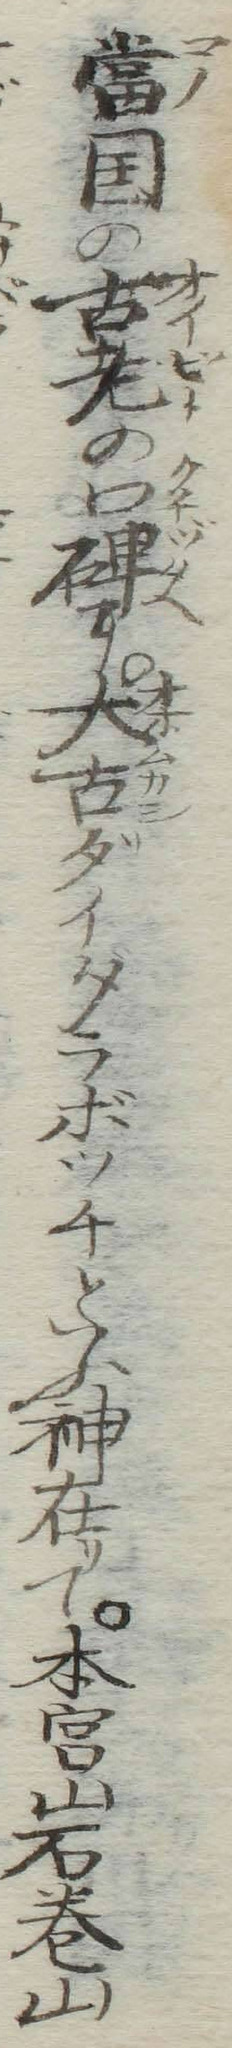当国の古老の口碑に。大古ダイダラボツチといふ神在りて。本宮山石巻山
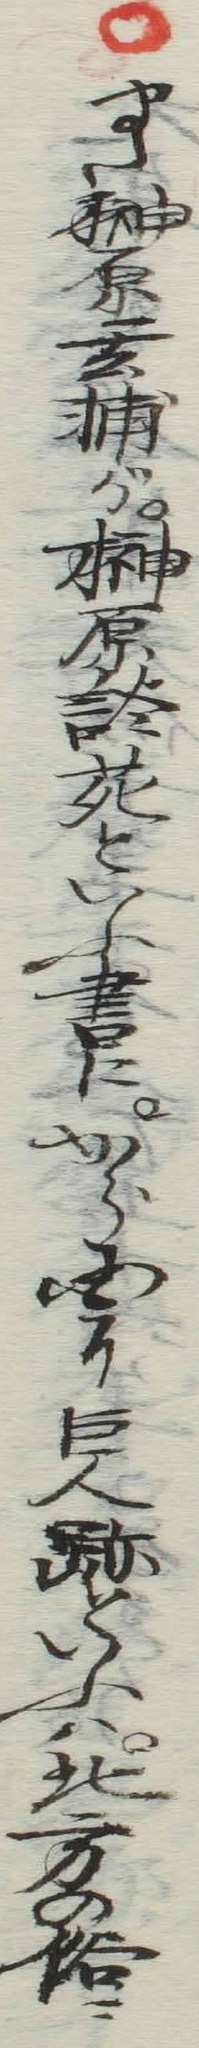〇また榊原玄輔が。榊原談苑といふ書に。から国に巨人跡といふは。北方の俗
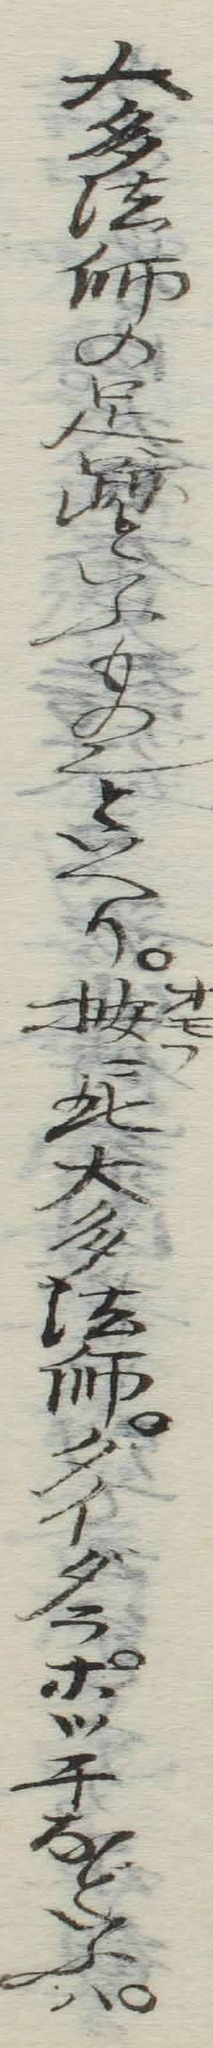大多法師の足跡といふもの也といへり。按此大多法師。ダイダラポッチなどいふは。
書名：三河国古跡考
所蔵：国文学研究資料館
